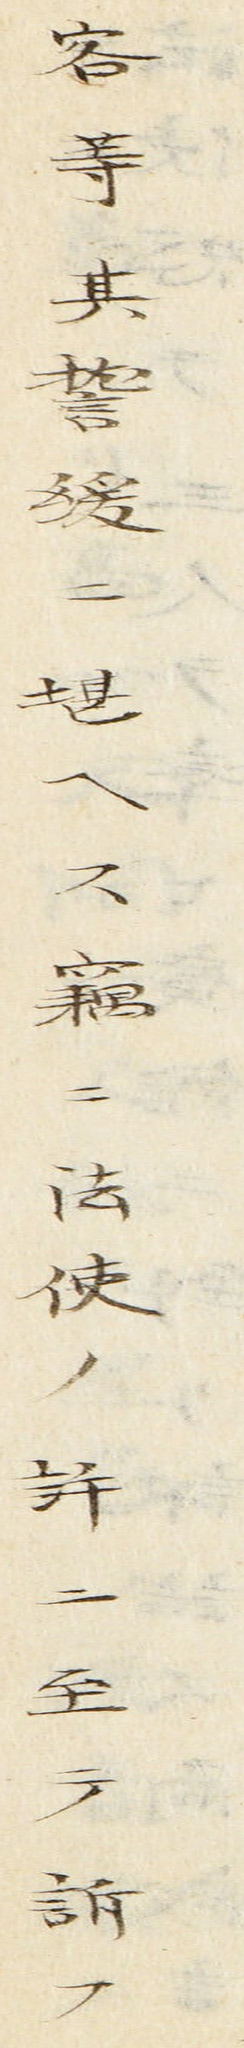客等其諬緩ニ堪ヘス竊ニ法使ノ許ニ至テ訴フ

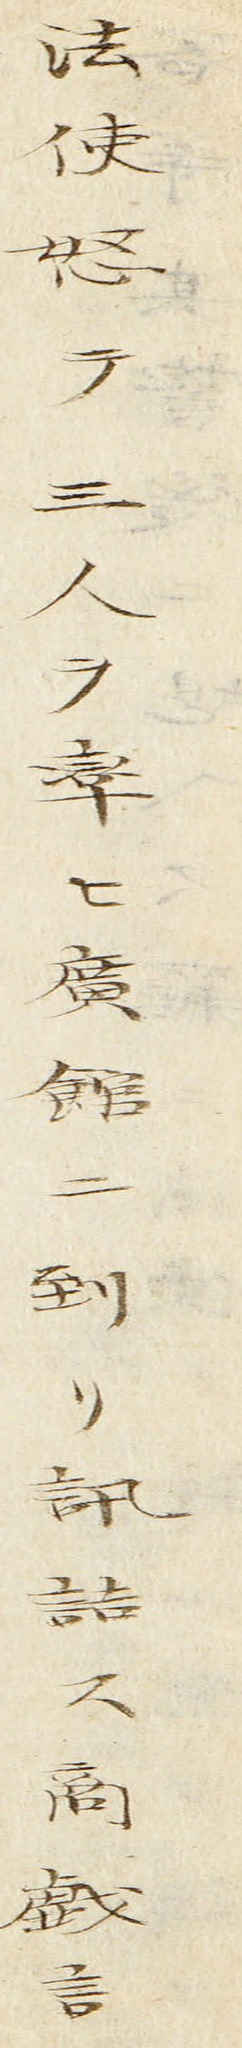法使怒テ三人ヲ率ヒ広館ニ到リ訊詰ス商戯言
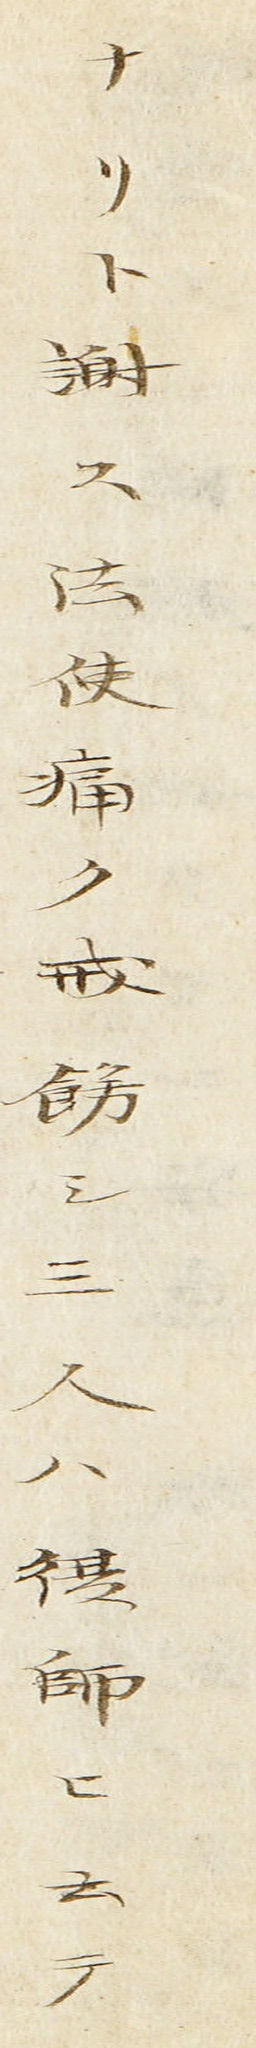ナリト謝ス法使痛ク戒シ三人ハ復師ヒ云テ
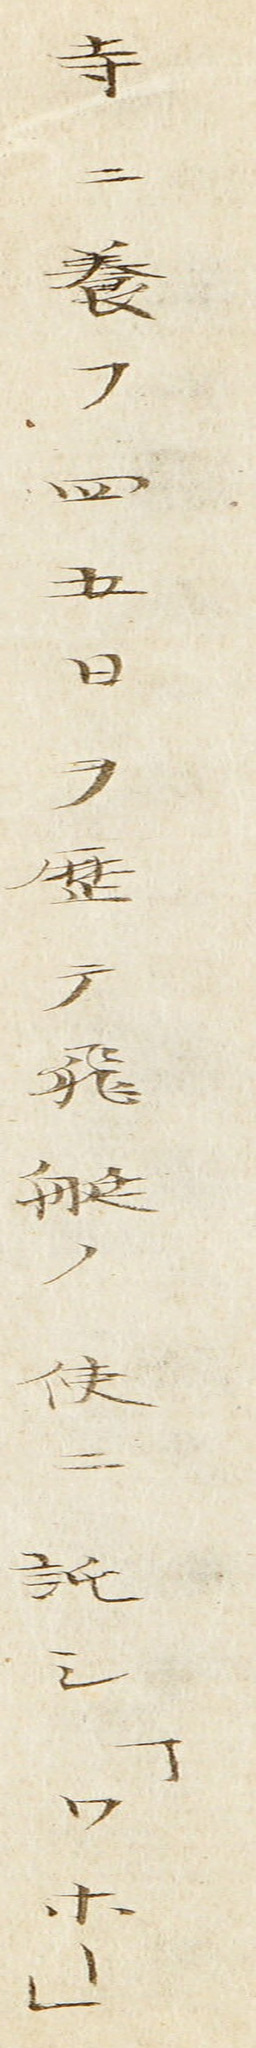寺ニ養フ四五日ヲ歴テ飛艇ノ使ニ託シ「ワホー」
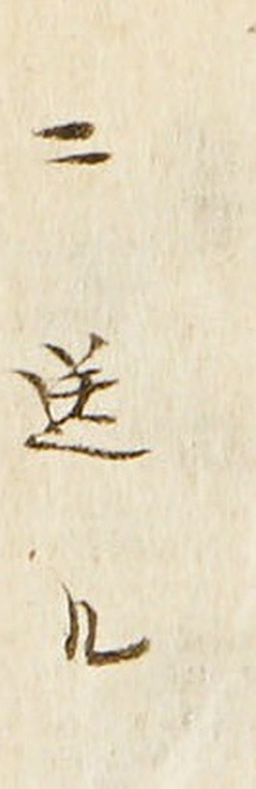ニ送ル
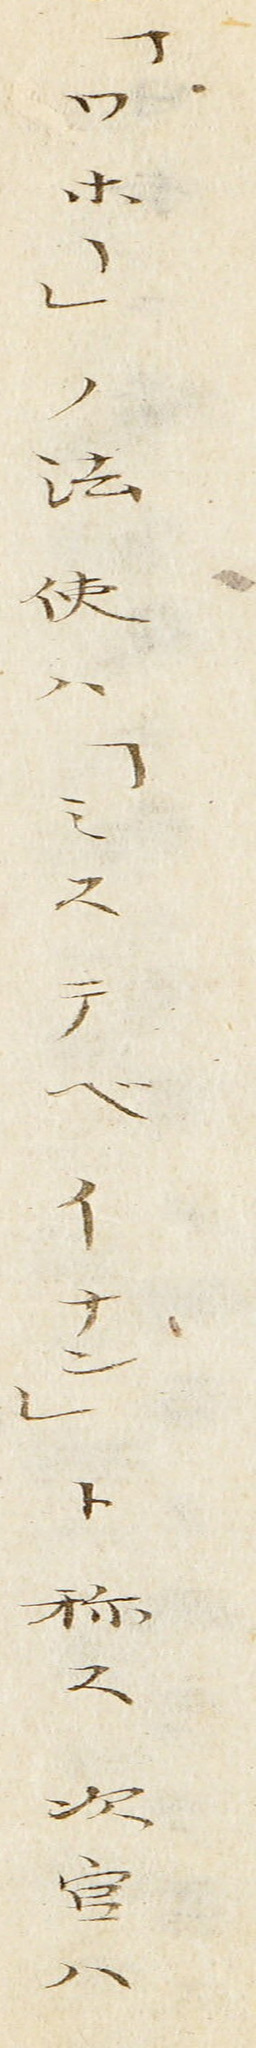○「ワホー」ノ法使ハ「ミステベイナン」ト称ス次官ハ
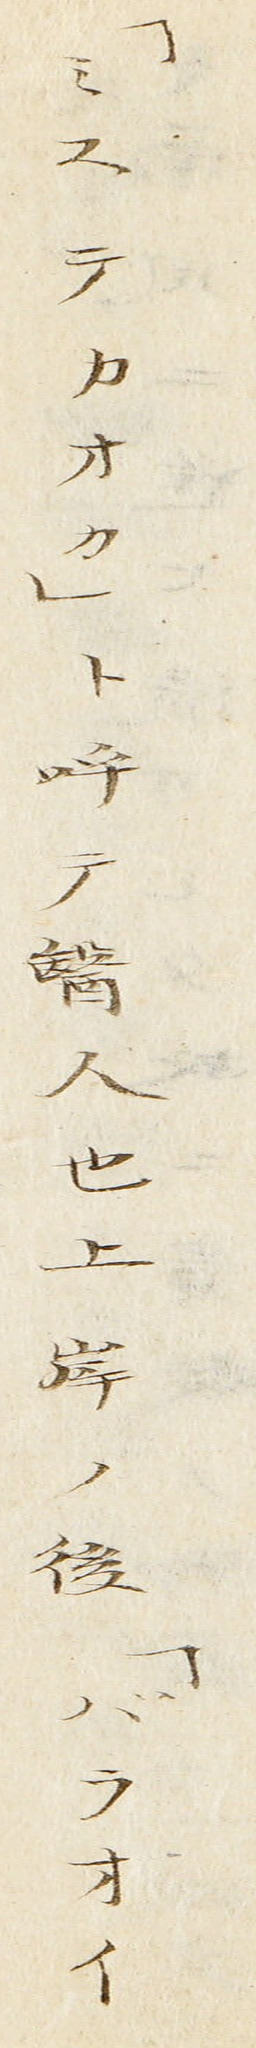「ミステカオカ」ト呼テ医人也上岸ノ後「バラオイ
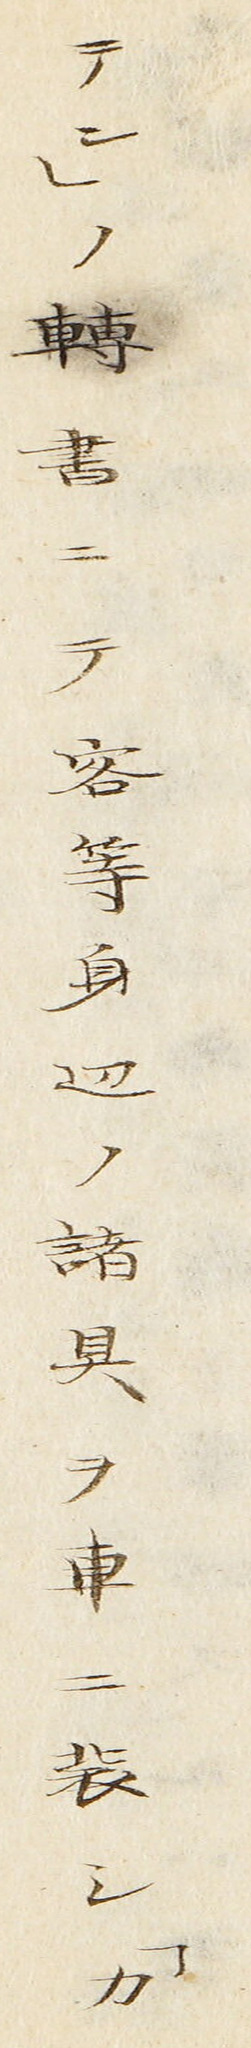テン」ノ転書ニテ客等身辺ノ諸具ヲ車ニシ「カ
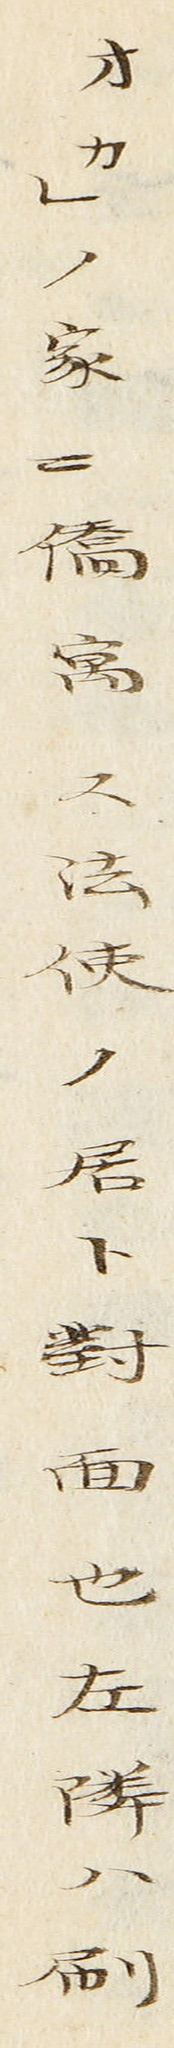オカ」ノ家ニ僑寓ス法使ノ居ト対面也左隣ハ刷
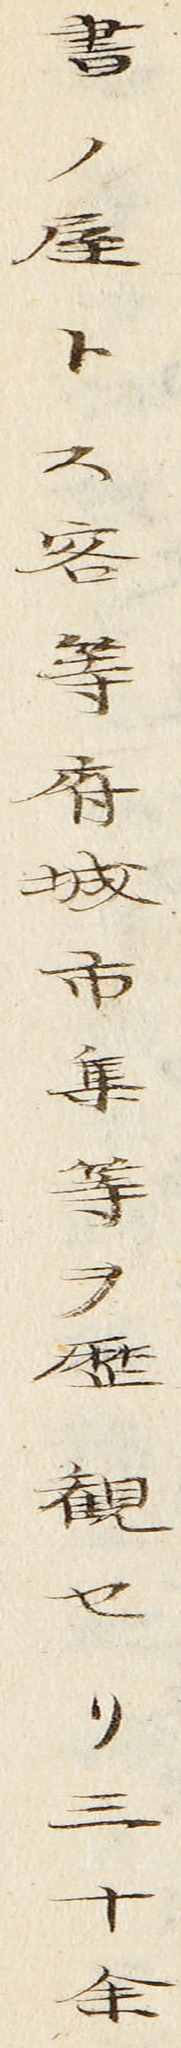書ノ屋トス客等府城市集等ヲ歴観セリ三十余
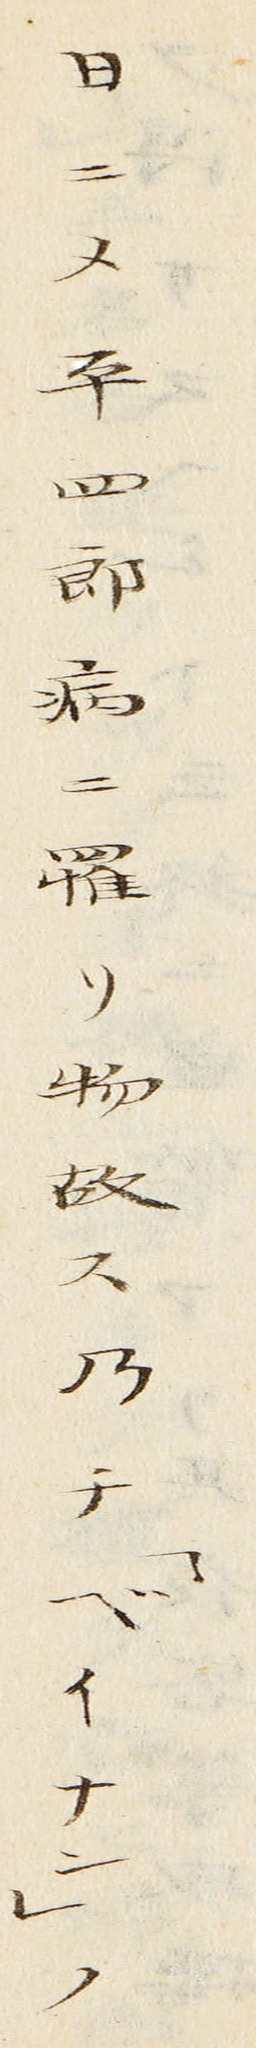日ニシテ平四郎病ニ罹リ物故ス乃チ「ベイナン」ノ
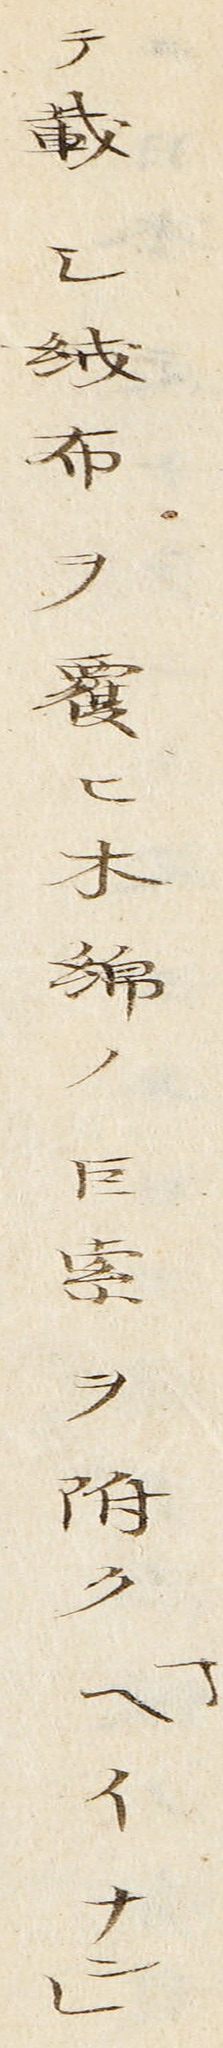テ載シ絨布ヲ覆ヒ木綿ノ巨索ヲ附ク「ヘイナン」
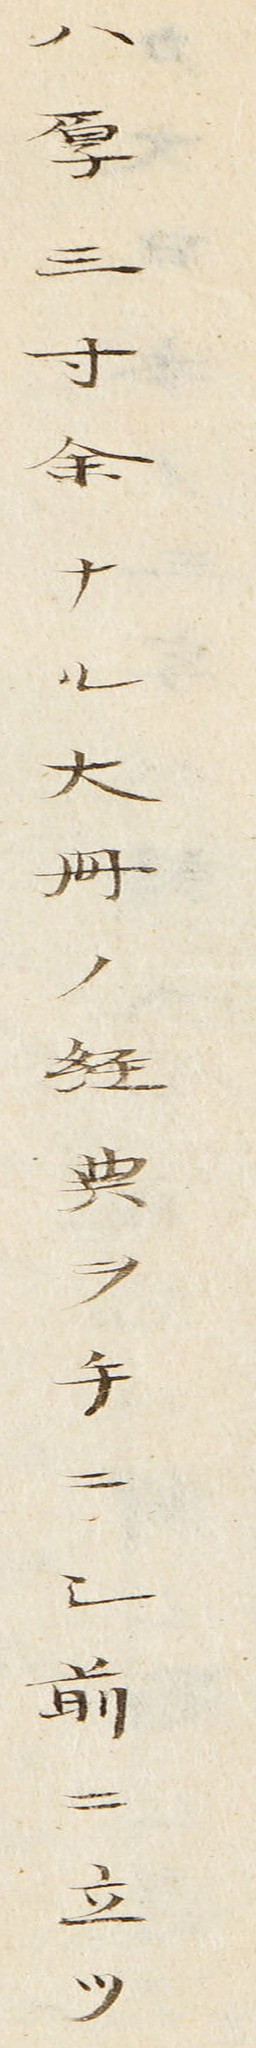ハ厚三寸余ナル大冊ノ経典ヲ手ニシ前ニ立ツ
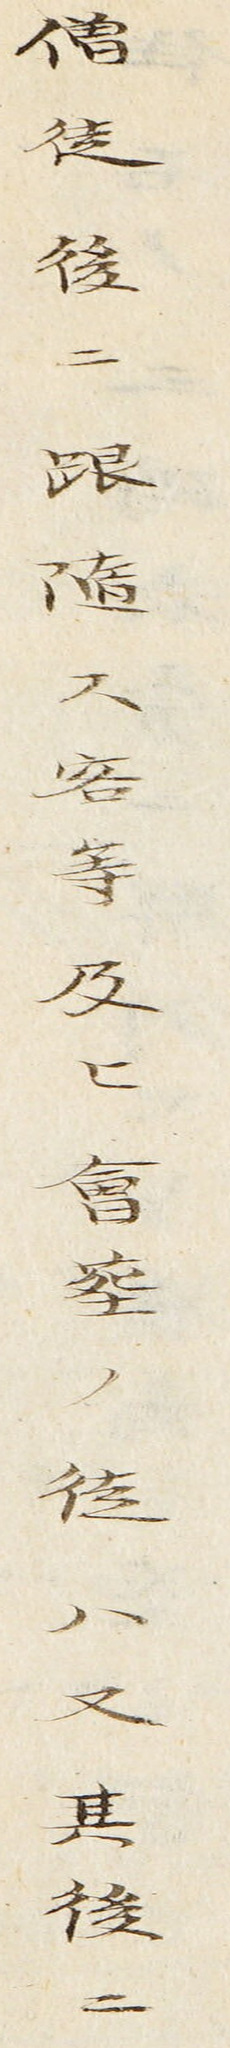僧徒後ニ跟随ス客等及ヒ会塟ノ徒ハ又其後ニ
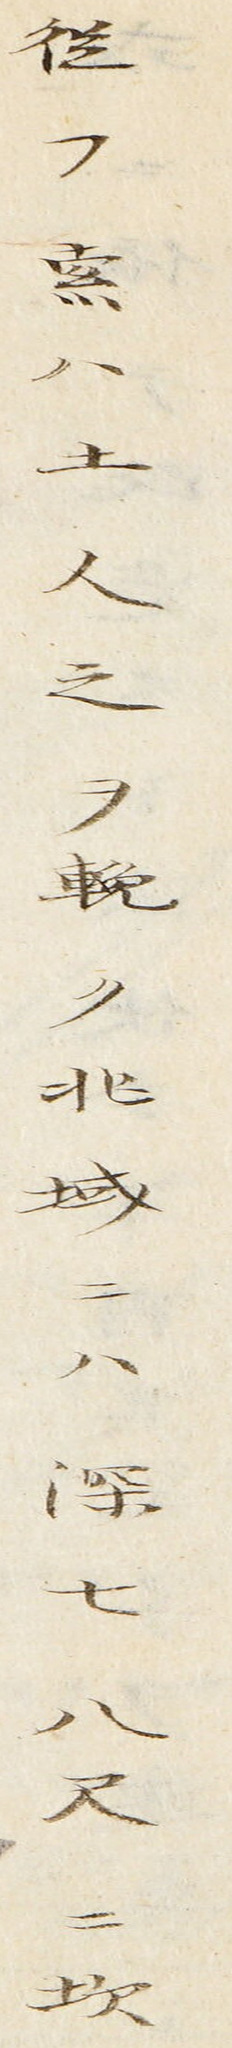従フ索ハ土人之ヲ輓ク兆域ニハ深七八尺ニ坎
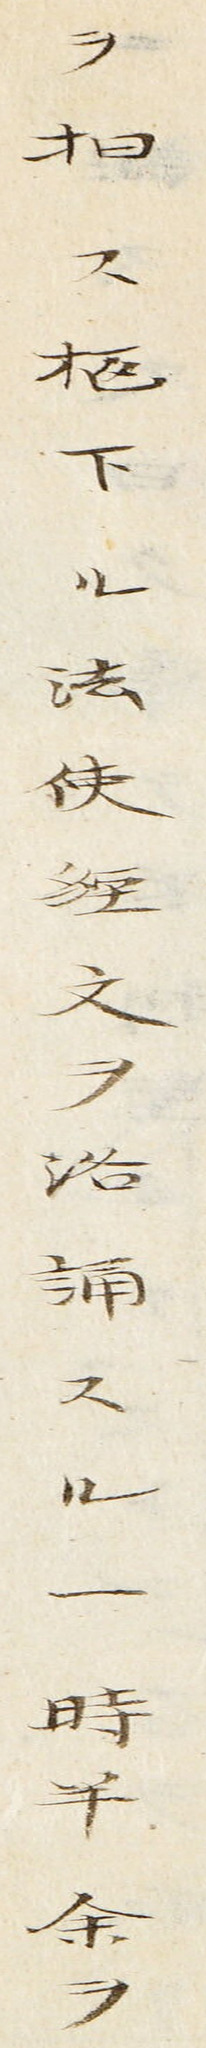ヲ抇ス柩下ル法使経文ヲ洛誦スル一時半余ヲ
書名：流蕃通書
